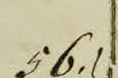56.
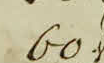60
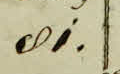81.
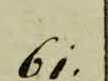61.
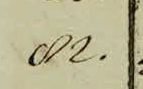82.
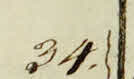34.
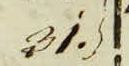31.
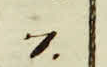7.
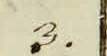3.
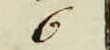6
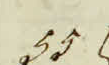55
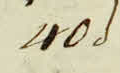40
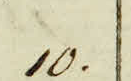10.
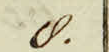8.
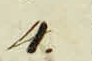4.
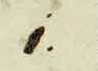1.
